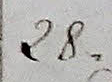28
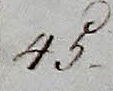45
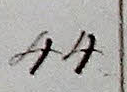44
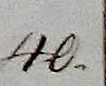40
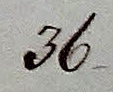36
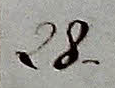28
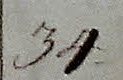34
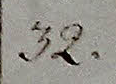32
